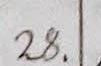28.
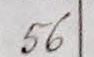56
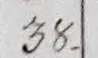38
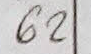62
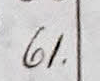61.
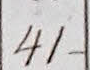41
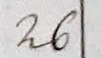26
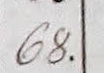68.
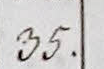35.
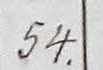54.
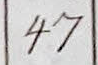47
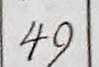49
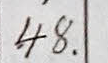48.
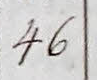46
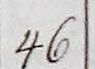46
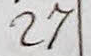27
